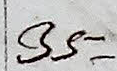35
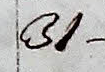31
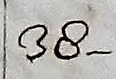38
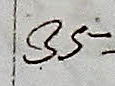35
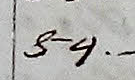54
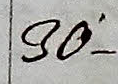30
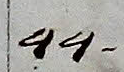44
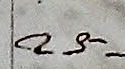25
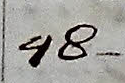48
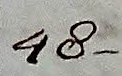48
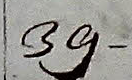39
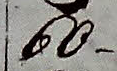60
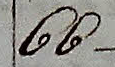66
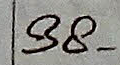38
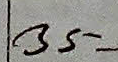35
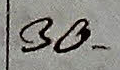30
